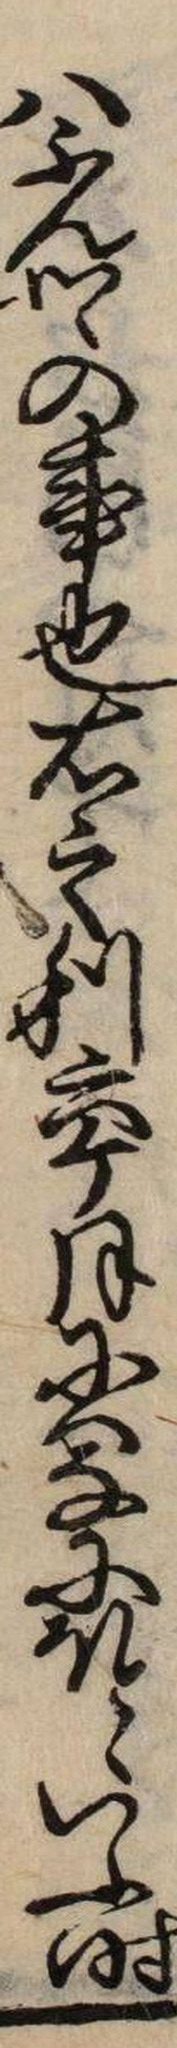八ふんつゝの事也右の利六ケ月にはなにほといふ時
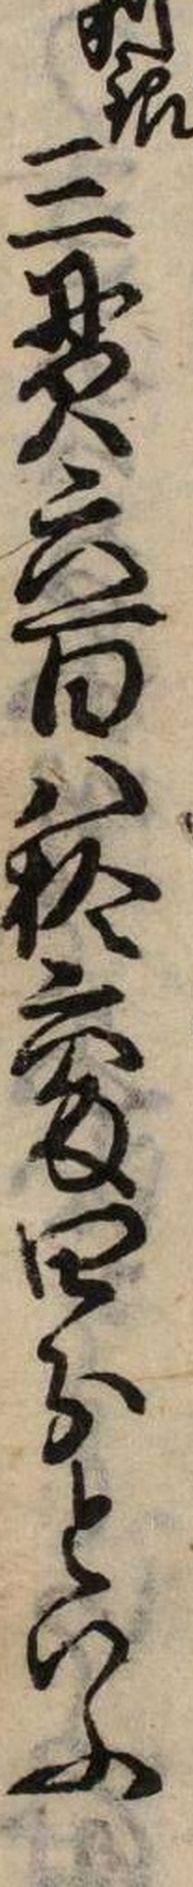利銀三貫六百八拾六匁四分といふ
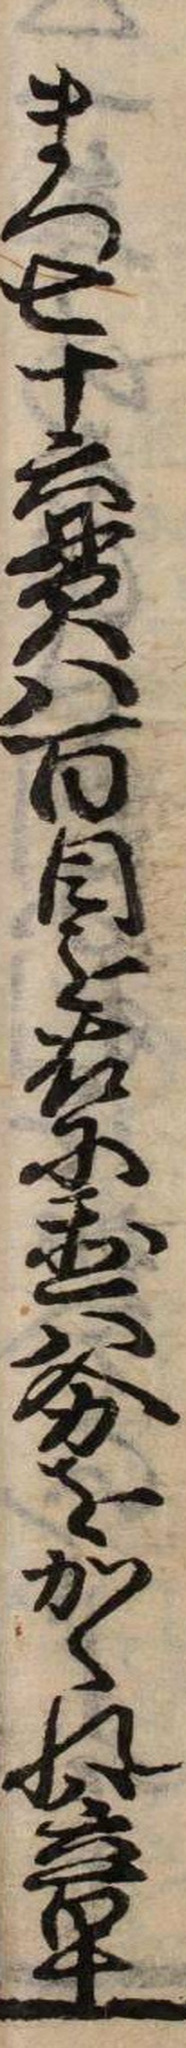まつ七十六貫八百目を右に置八分をかくれは六百十
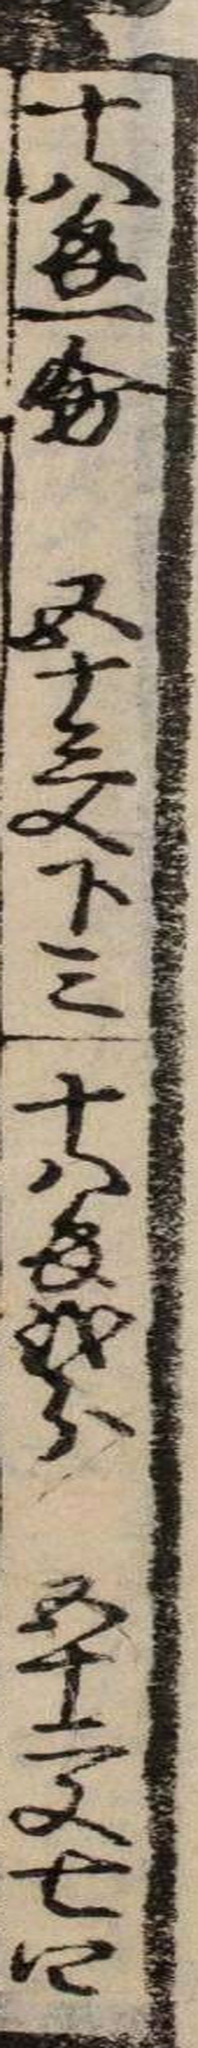十八匁一分五十三文下三十八匁弐分五十二文七四
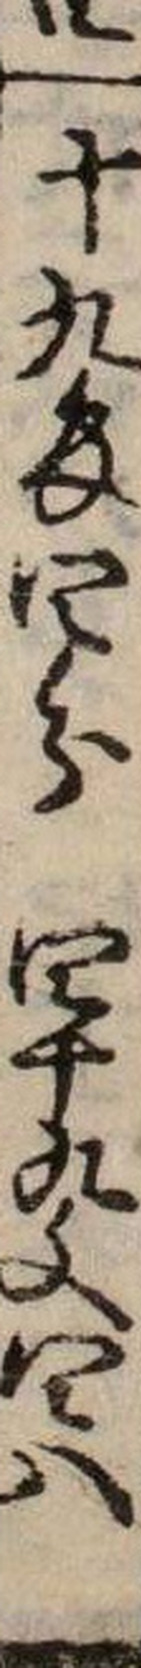十九匁三分四十九文七四十九匁四分四十九匁四八
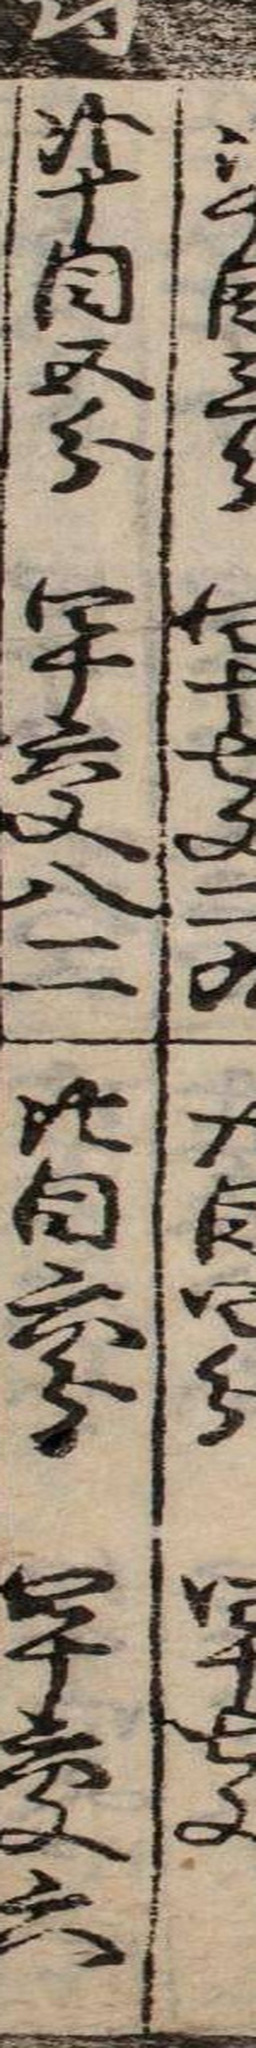弐十目五分四十六文八二廿目六分四十六文六

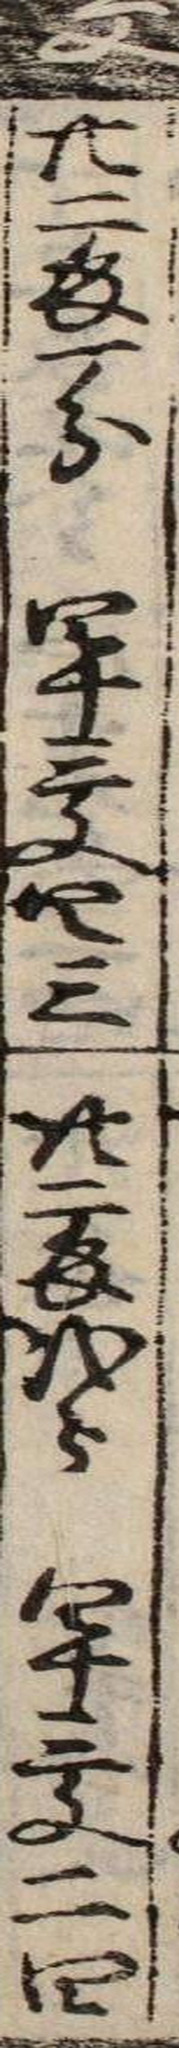廿二匁一分四十三文四三廿二匁弐分四十三文二四
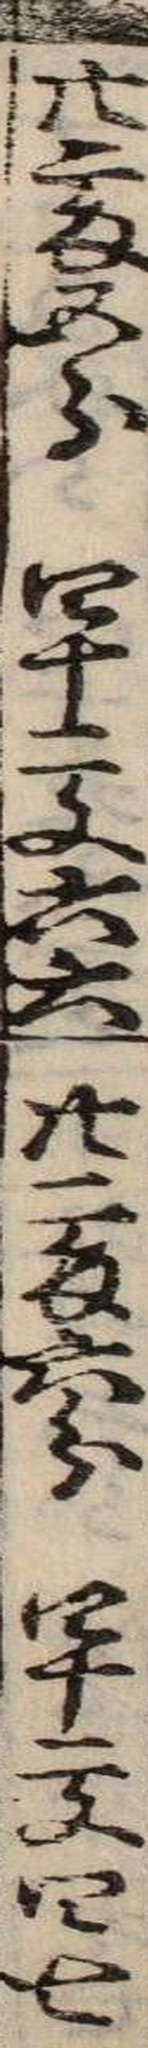廿二匁五分四十二文六六廿二匁六分四十二文四七
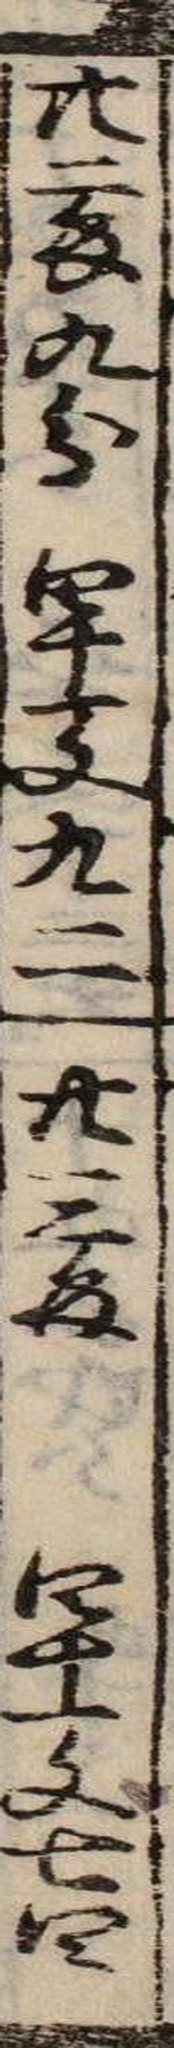廿二匁九分四十一文九二廿三匁四十一文七四
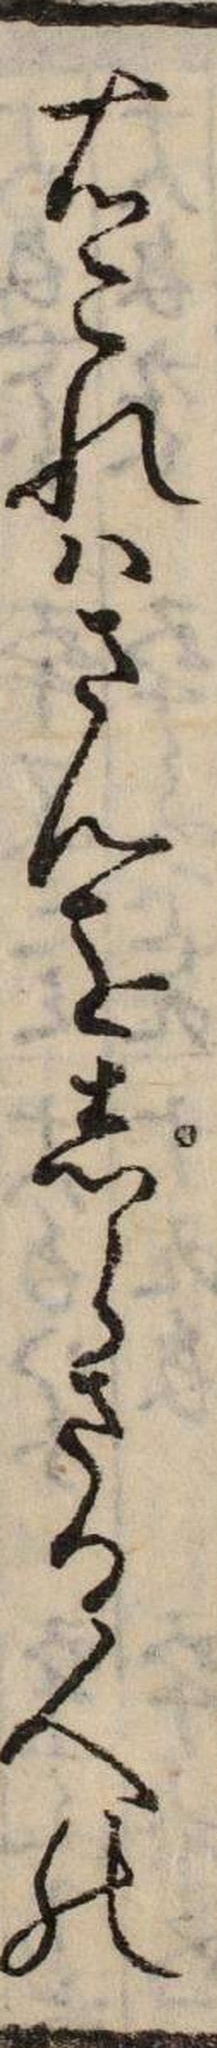右これはさんをしらさる人の
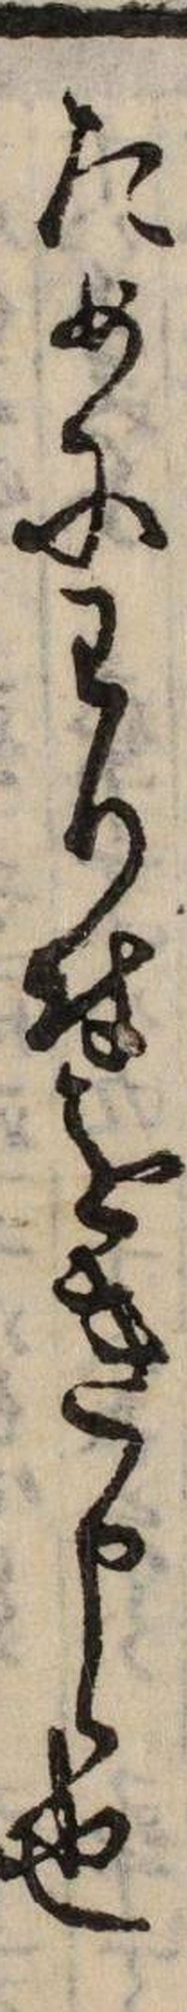ためにわり付をき申候也
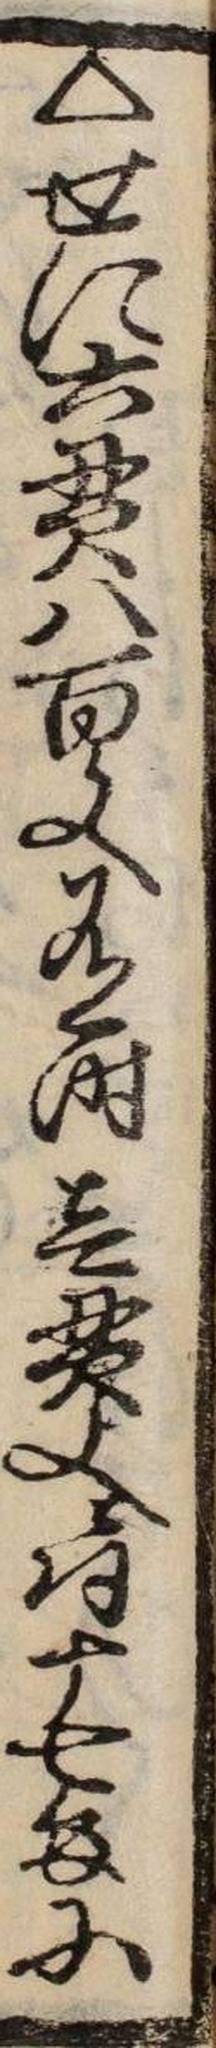△せに六貫八百文有時壱貫文に付十七匁に
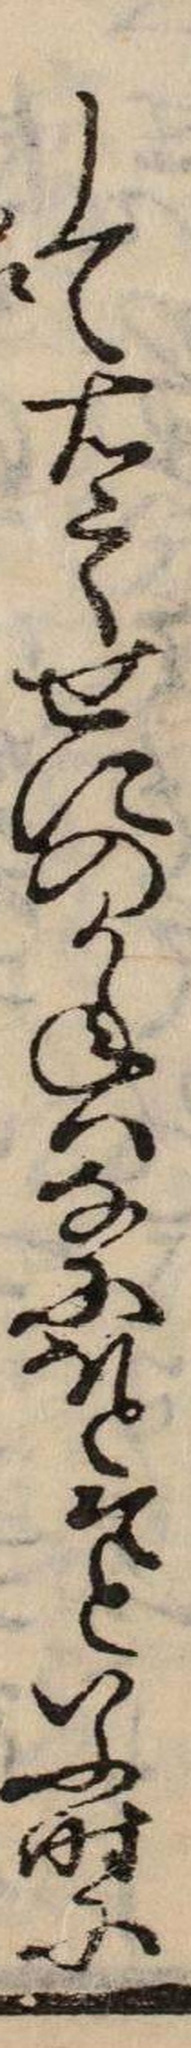して右のせにのかねはなにほとそといふ時に
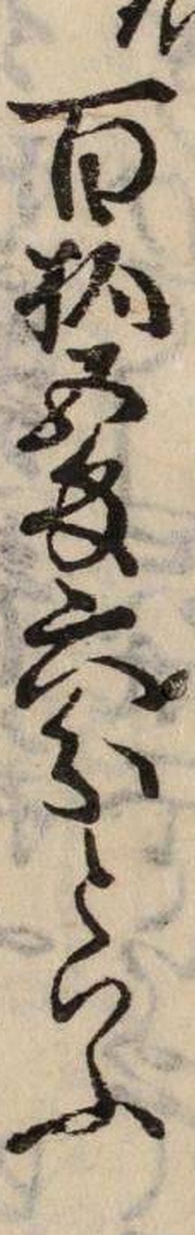銀百拾五匁六分といふ
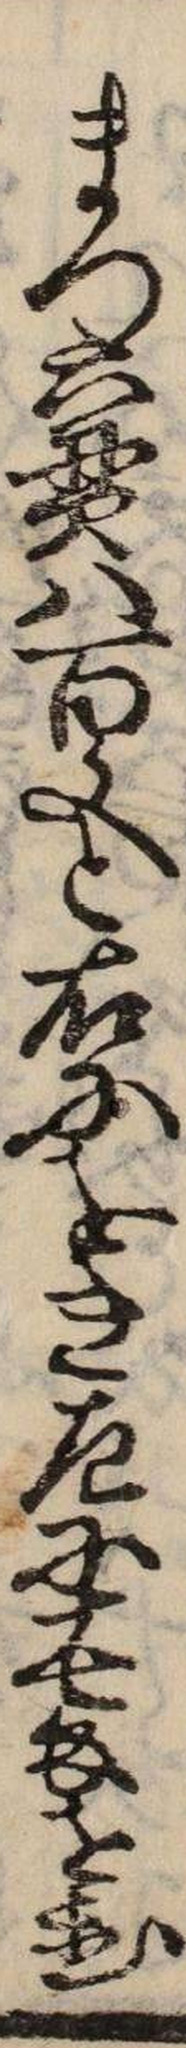まつ六貫八百文と右にをき左に十七匁を置
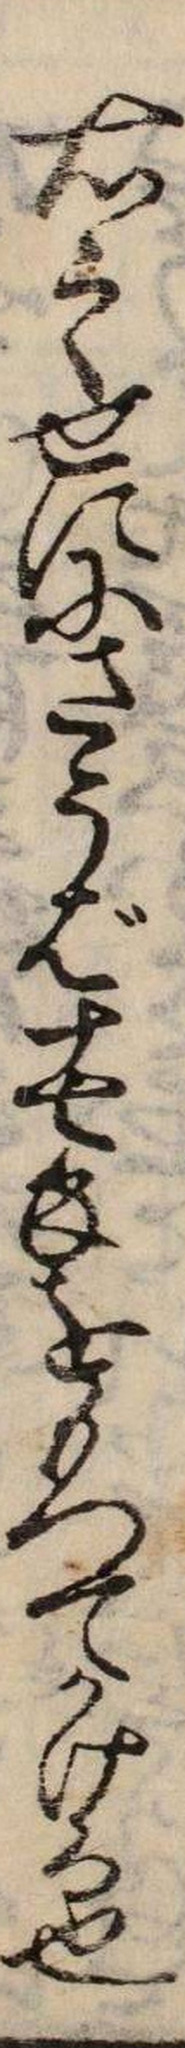右のせににさうば十七匁をもつてかける也
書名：塵劫記（寛永11年自跋、京都府立京都学・歴彩館追貴8）
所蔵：京都府立京都学・歴彩館 国文学研究資料館
